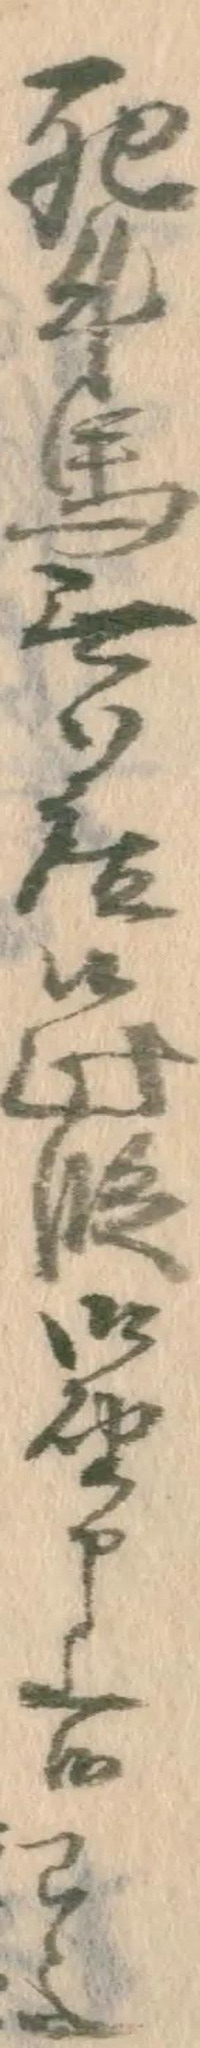死失馬無御座候此段御届申上候已上
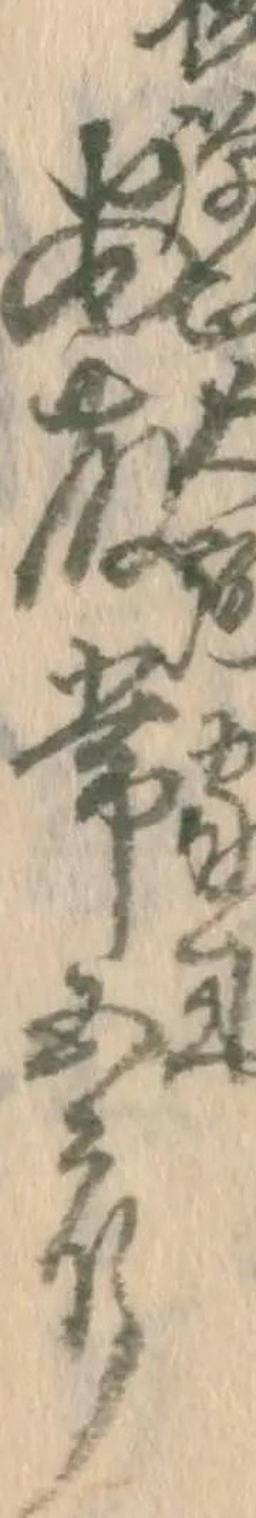安藤常五郎
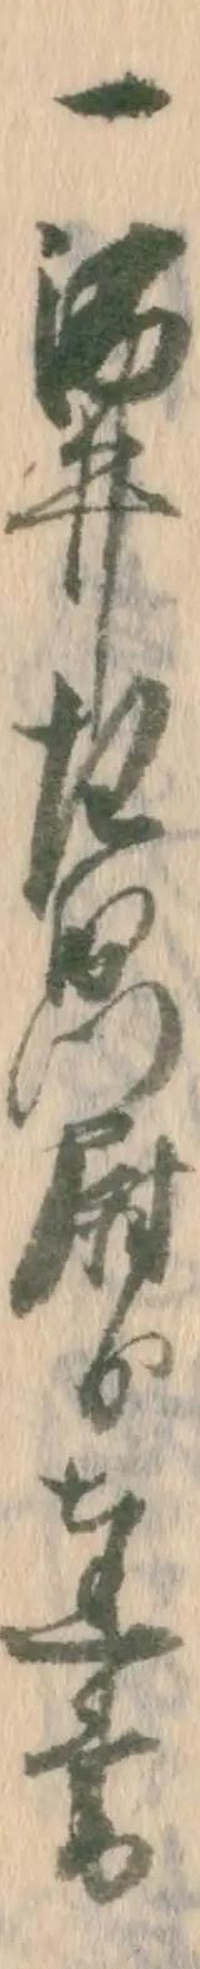一酒井左衛門尉ゟ達書
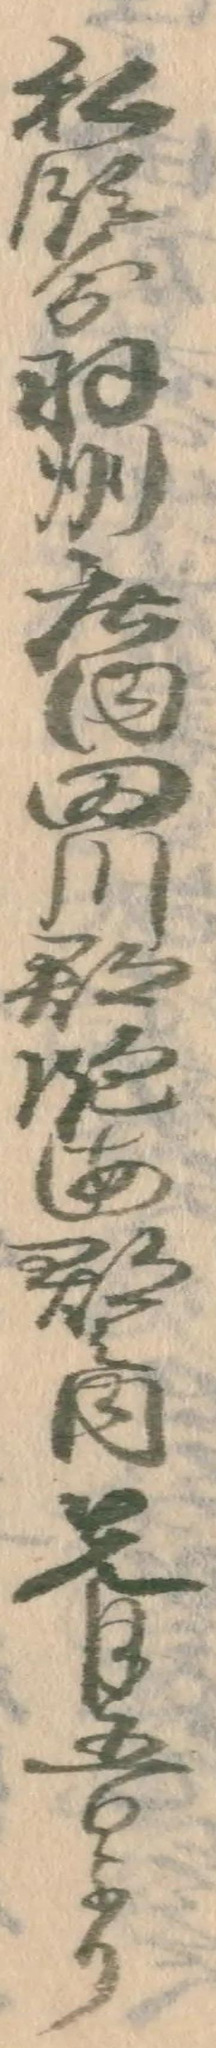私領分羽州庄内田川郡飽海郡之内先月五日より
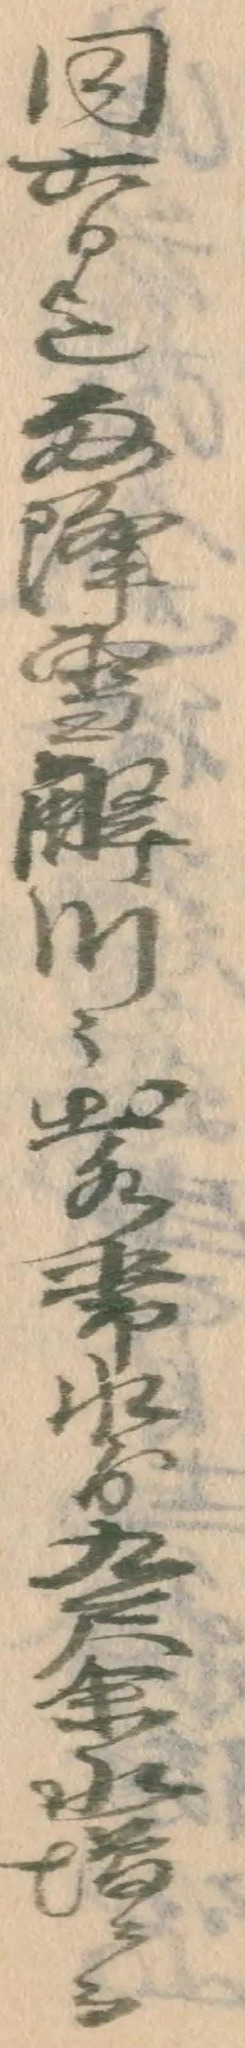同廿迄雨降雪解川々出水常水ゟ九尺余水増二而
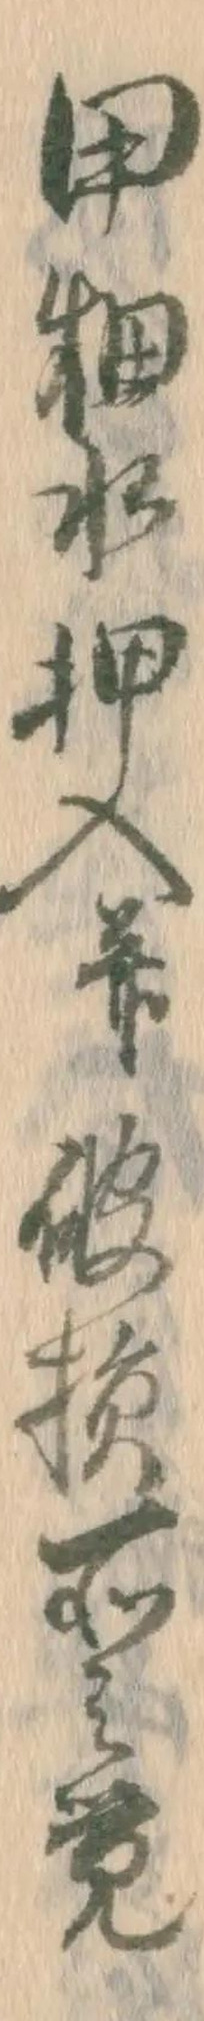田畑水押入并破損所之覚
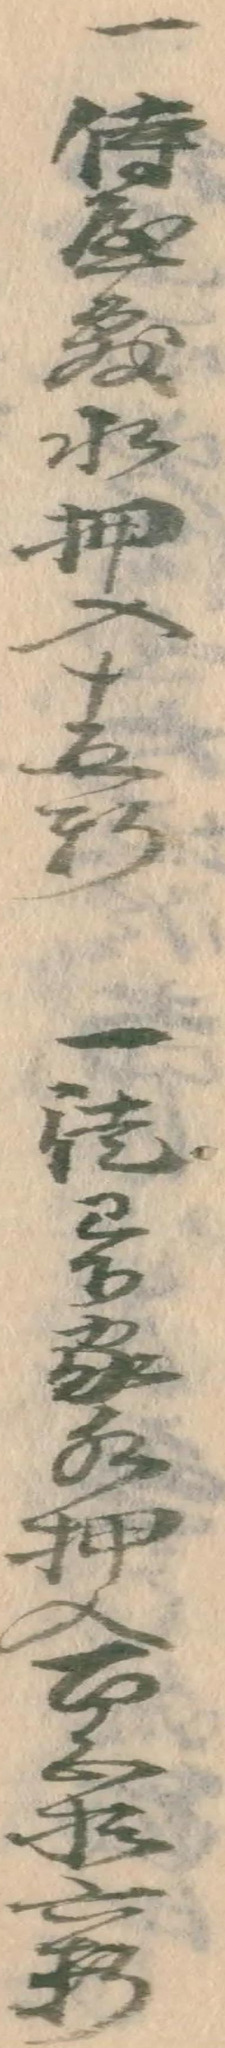一侍屋敷水押入十五軒一徒士下家水押入百五拾六軒
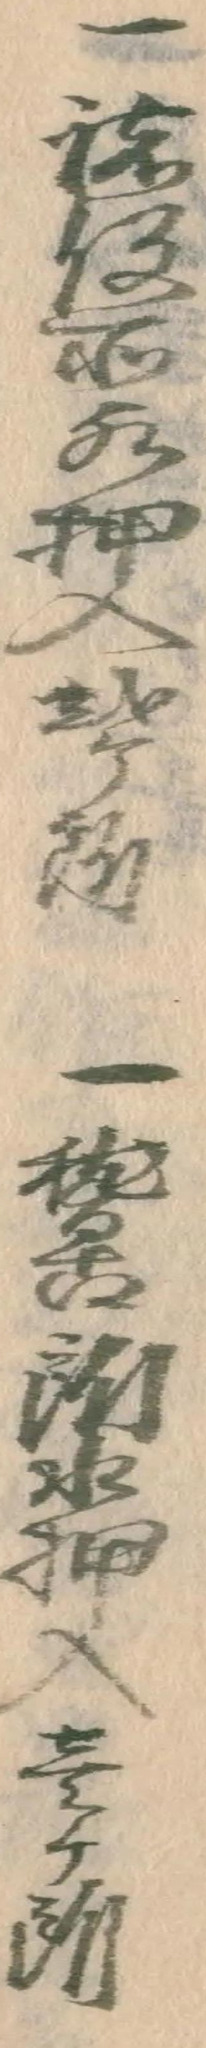一諸役所水押入弐ヶ所一稽古所水押入壱ヶ所
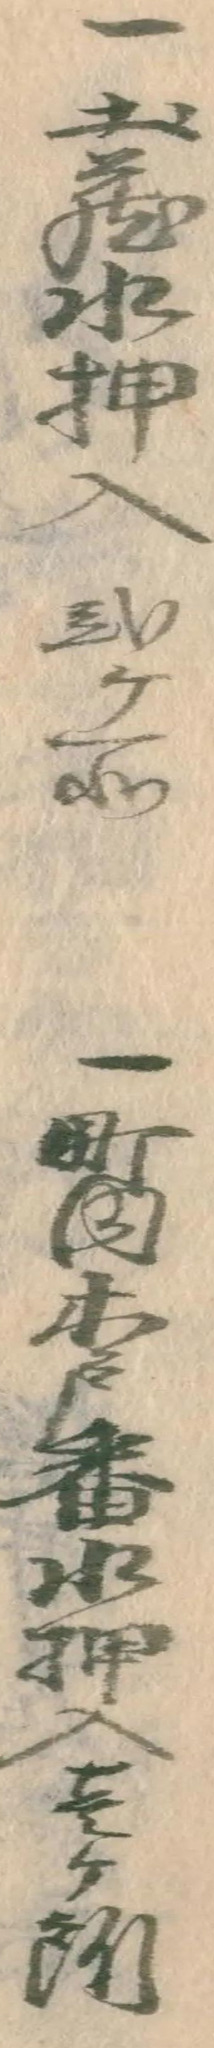一土蔵水押入弐ヶ所一町内木戸番水押入壱ヶ所
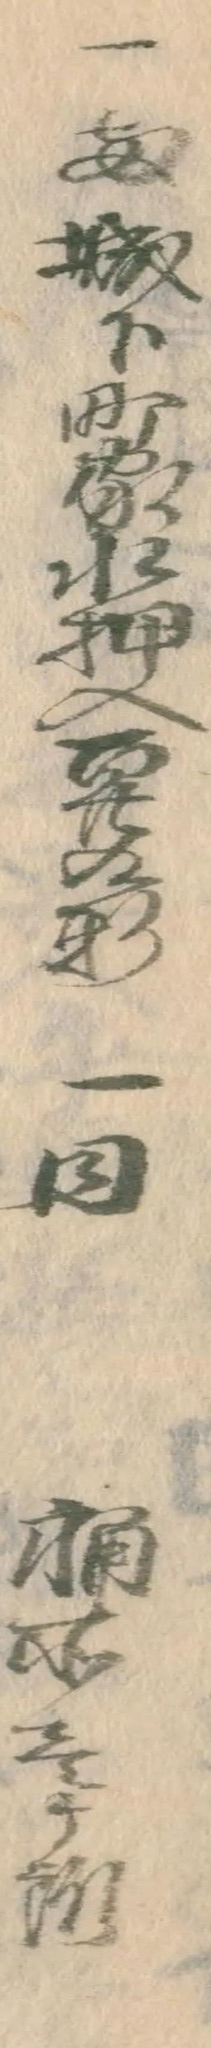一両城下町家水押入百廿九軒一同痛所壱ヶ所
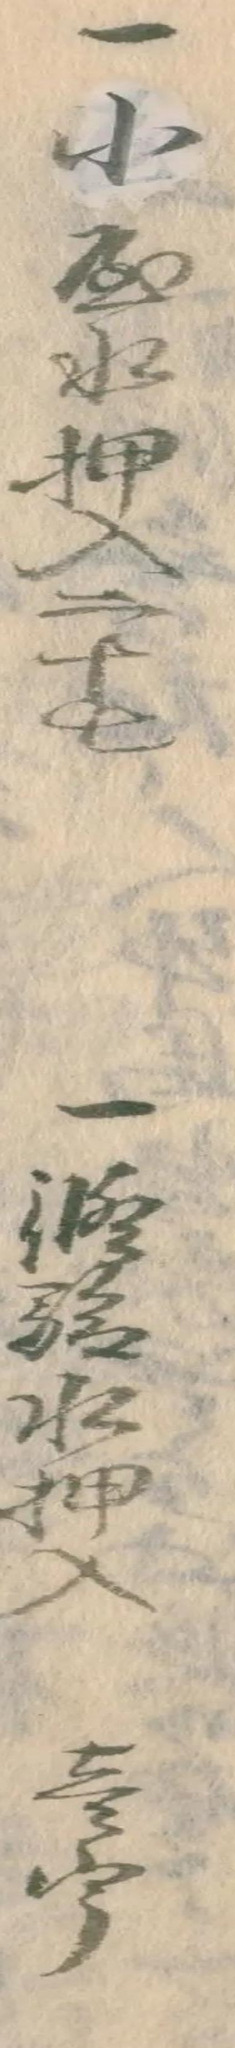一小屋水押入二十七一修験水押入壱宇
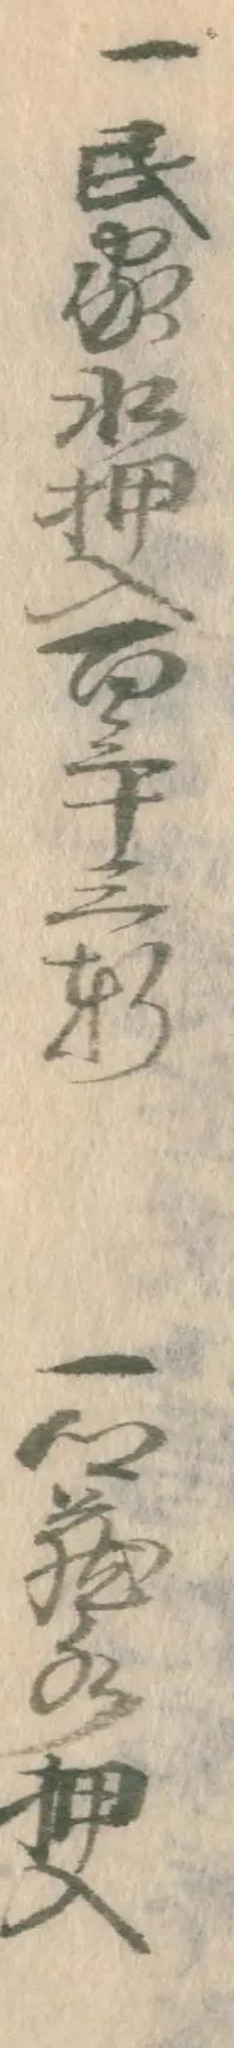一民家水押入百三十三軒一郷蔵水押入壱
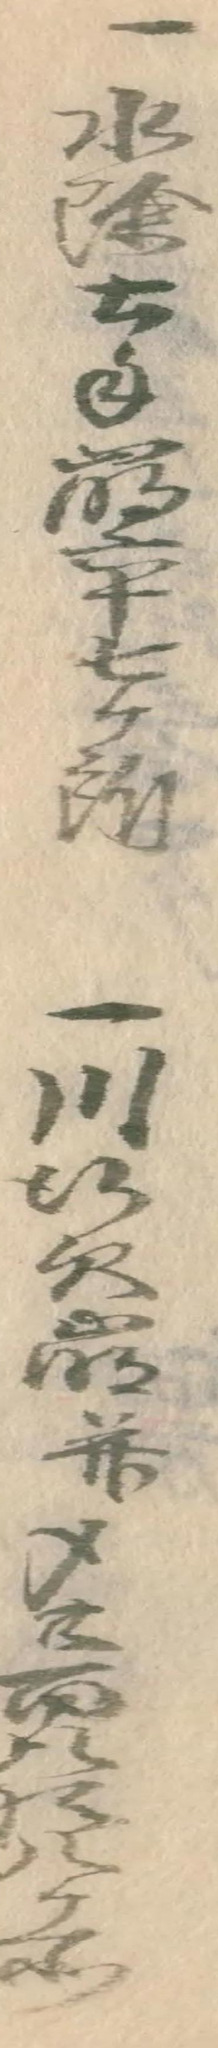一水除土手崩六十七ヶ所一川行欠崩并〆共百八拾八ヶ所
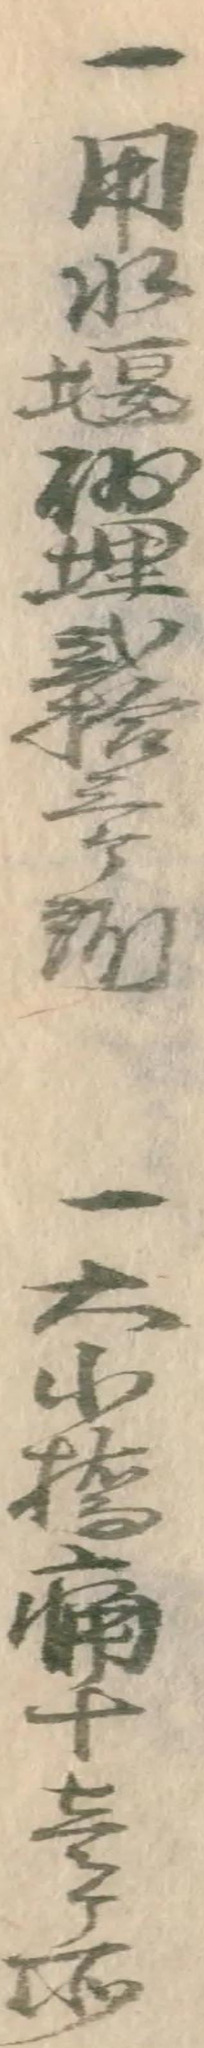一用水堰砂埋弐拾三ヶ所一大小橋痛十壱ヶ所

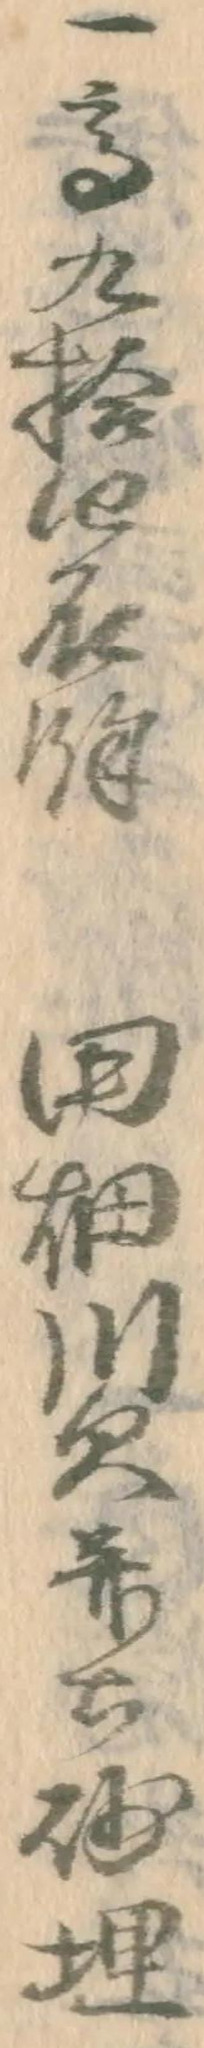一高九拾四石余田畑川欠并土砂埋
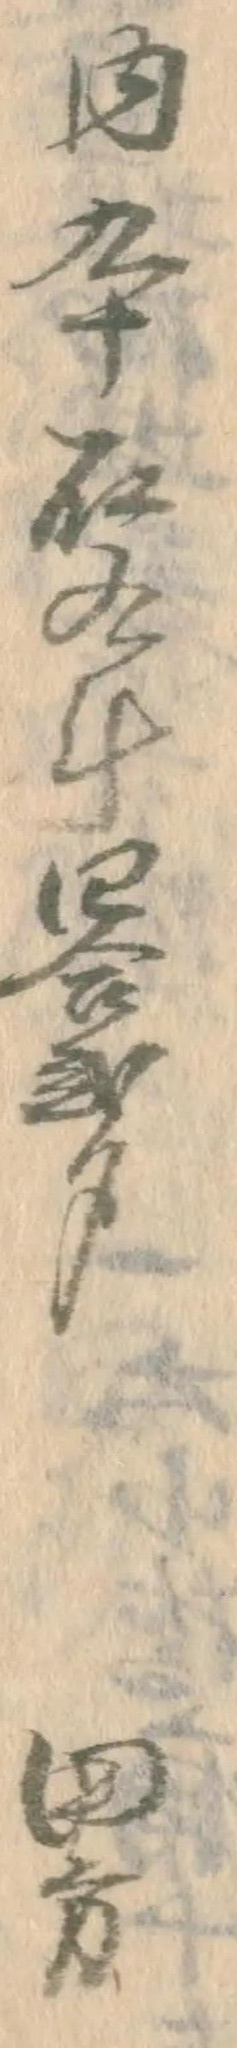内九十石九斗四合弐夕田方
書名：信州大地震之記
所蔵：国立国会図書館 National Diet Library, JAPAN
